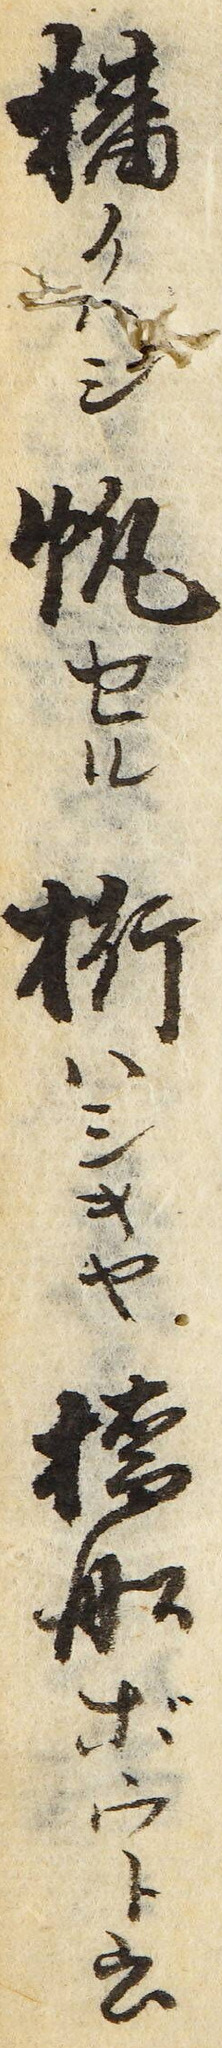檣イハジ帆セル桁ハシキヤ橋船ボウト云

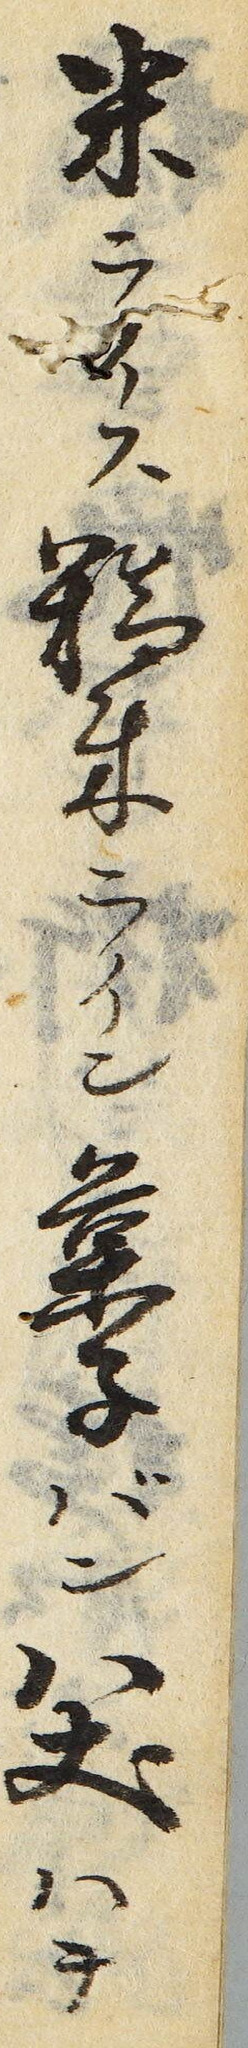米ライス木ライン菓子バン八丈ハチ
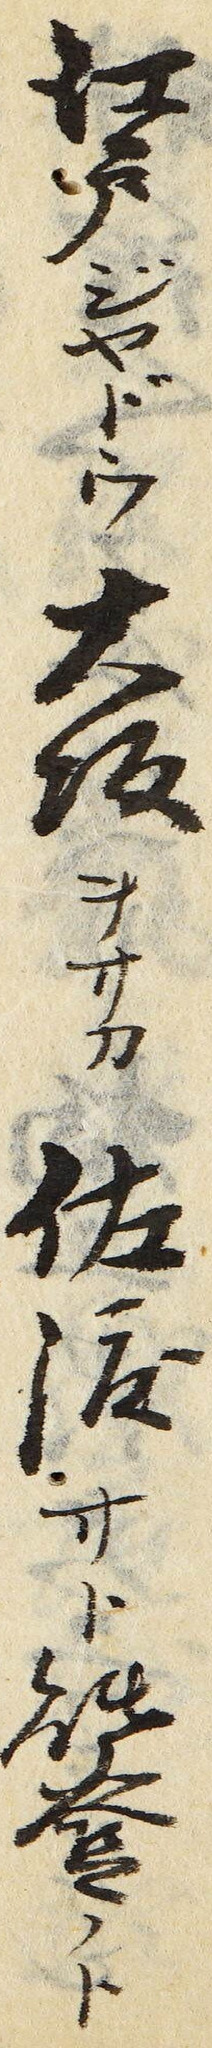江戸ジヤドウ大坂ヲサカ佐渡サト能登ノト
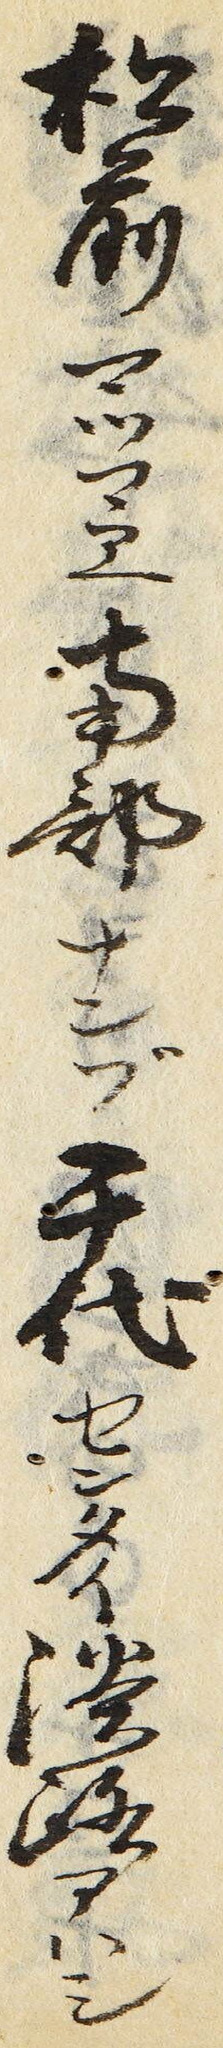松前マツマエ南部ナンブ千代センタイ淡路アハシ
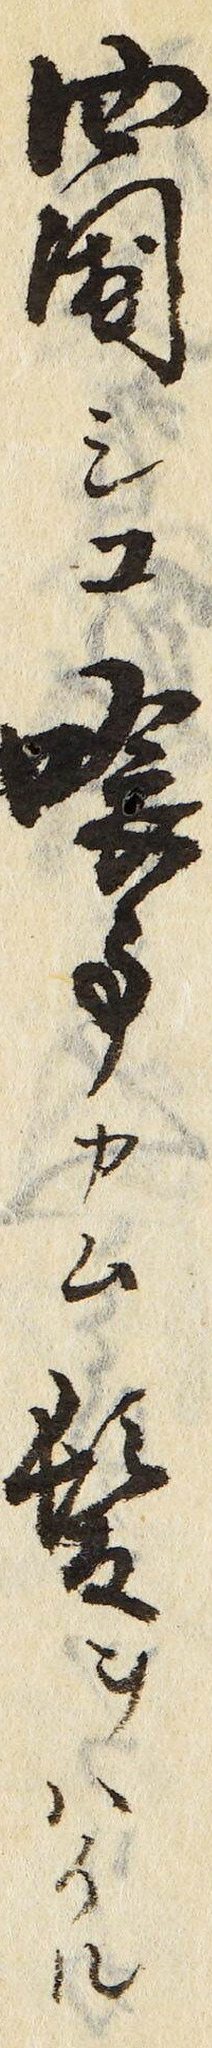四国シコ食事カム髪ヲハイル
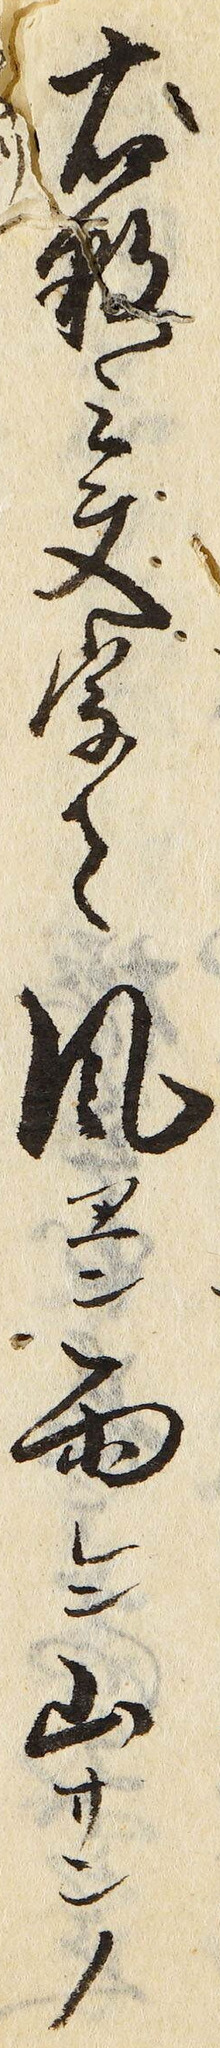右数之文字風ゑン雨レン山サンノ
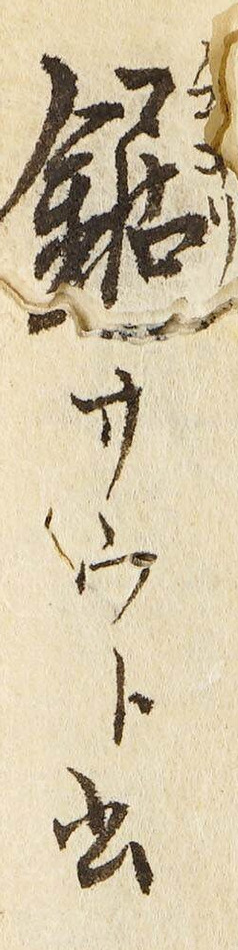鋸サウト書
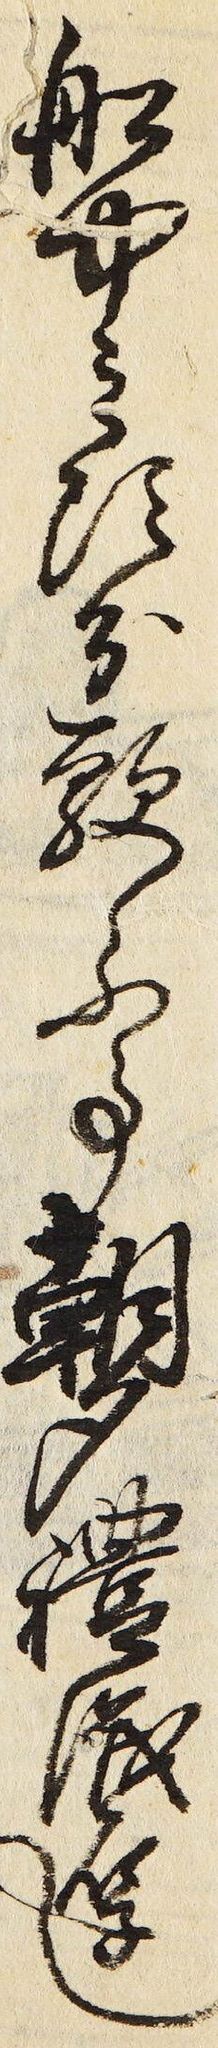船中之頭分願ふ事朝夕礼儀厚し
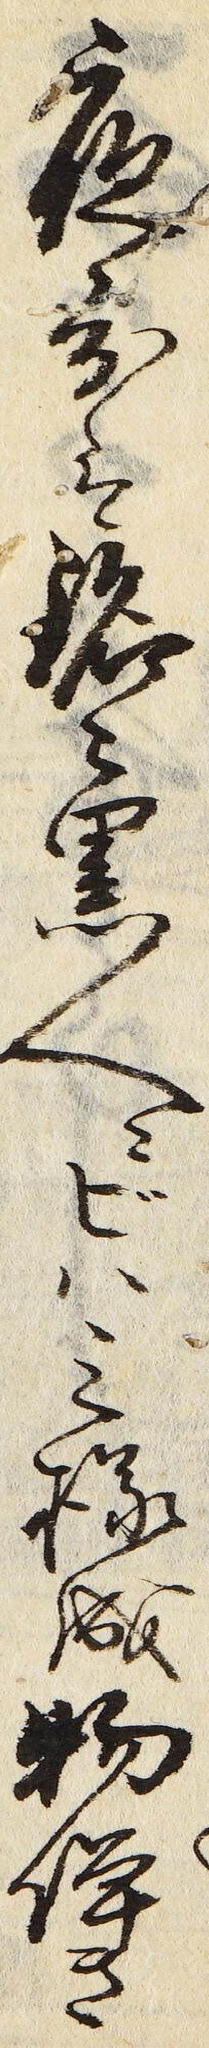夜分は銘々黒人ニビハ之様成物弾き
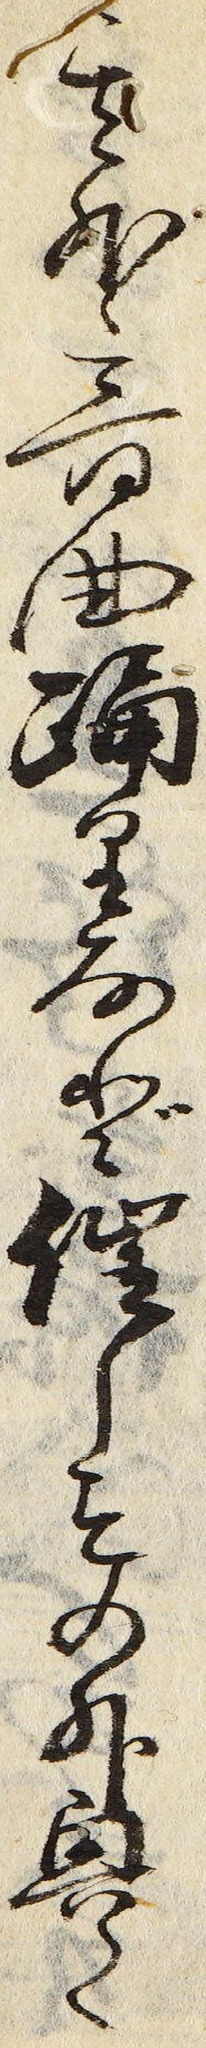其外音曲踊りなど催しことの外興之
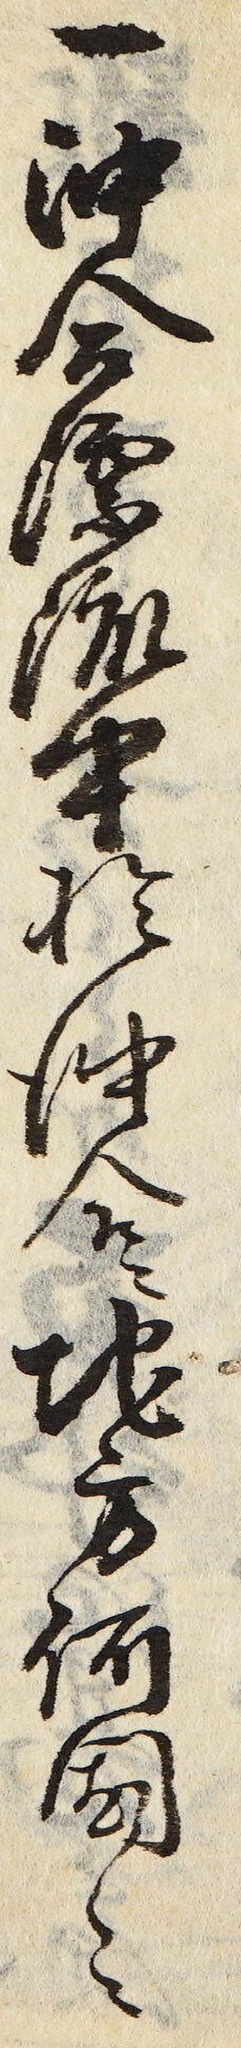一沖合漂流中於沖合ニ地方何国之
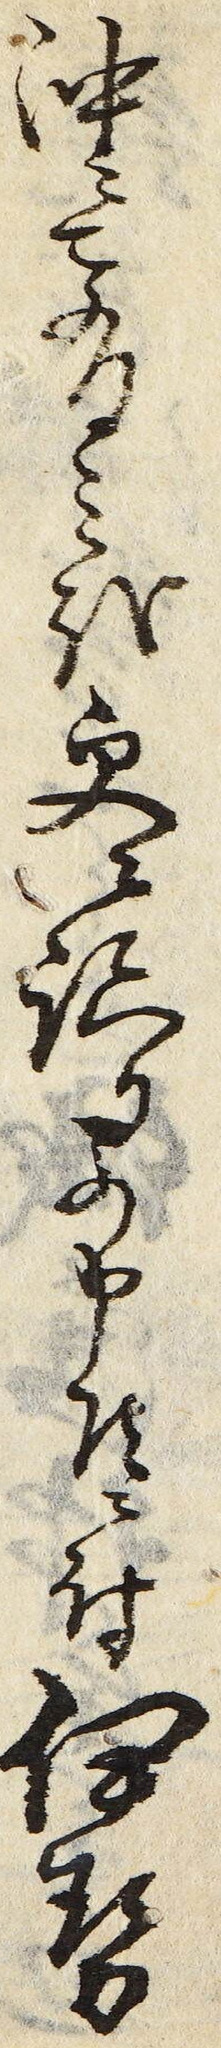沖ニ可有之哉更ニ訳り不申候ニ付伊勢
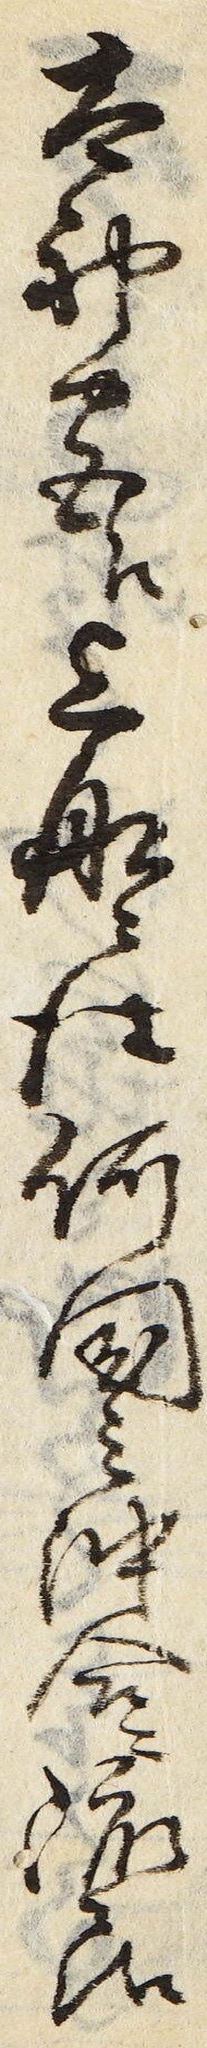大神宮え上船ニ仕何国之沖合ニ流居
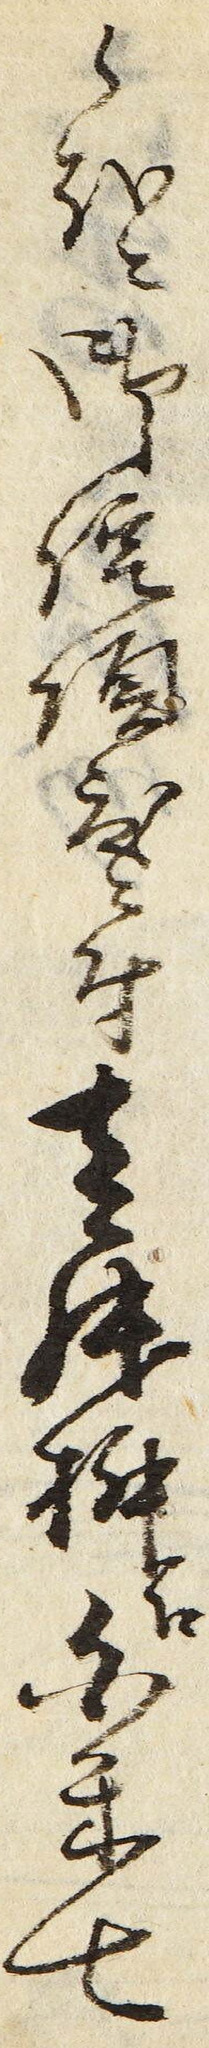候哉と御託頂度ニ付壱升枡え白米七
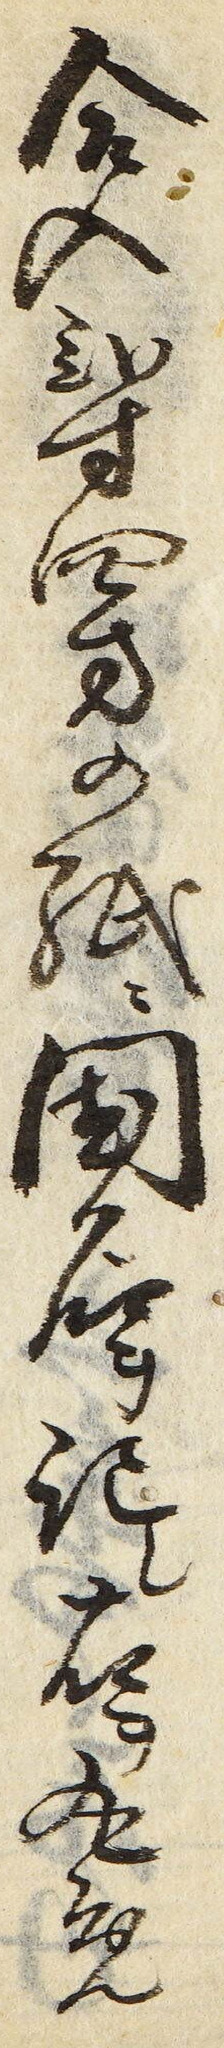合入弐寸四方の紙ニ国名ヲ記し右ヲ丸め
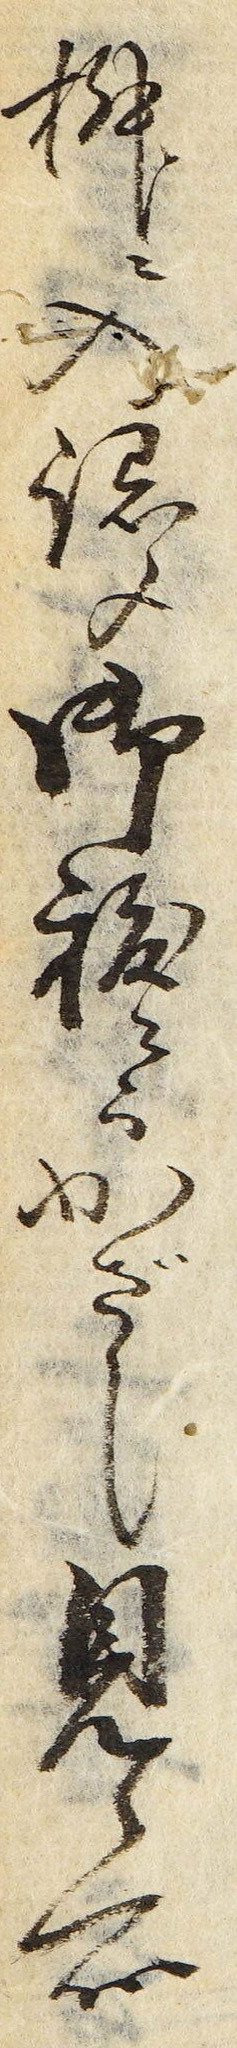枡ニ入認メ御祓ニ而かざし見候所
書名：阿波幸宝丸漂流記
